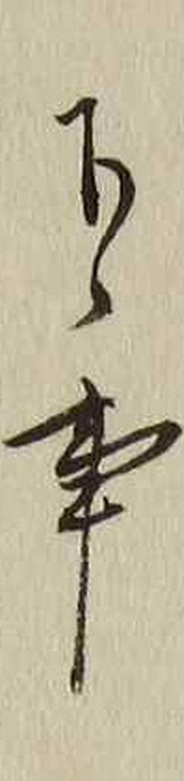下候事
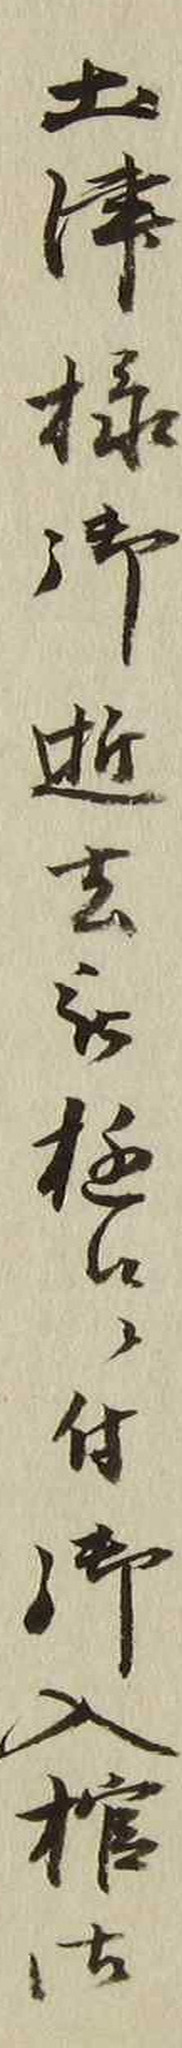土津様御逝去被遊候ニ付御入棺御
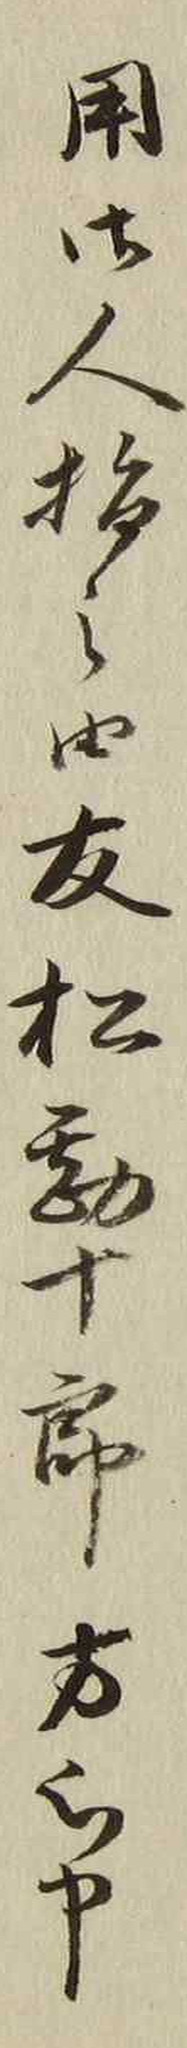用御人指之由友松勘十郎方被申
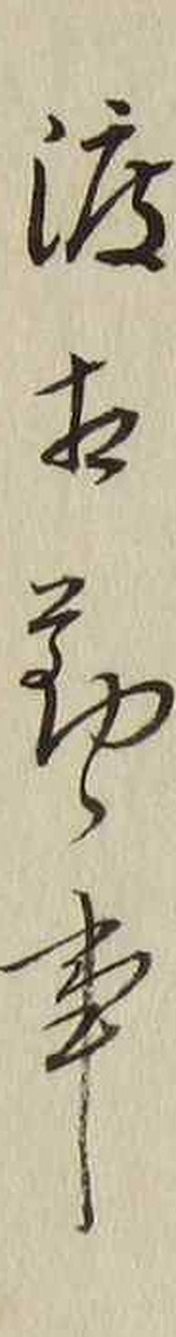渡相勤候事
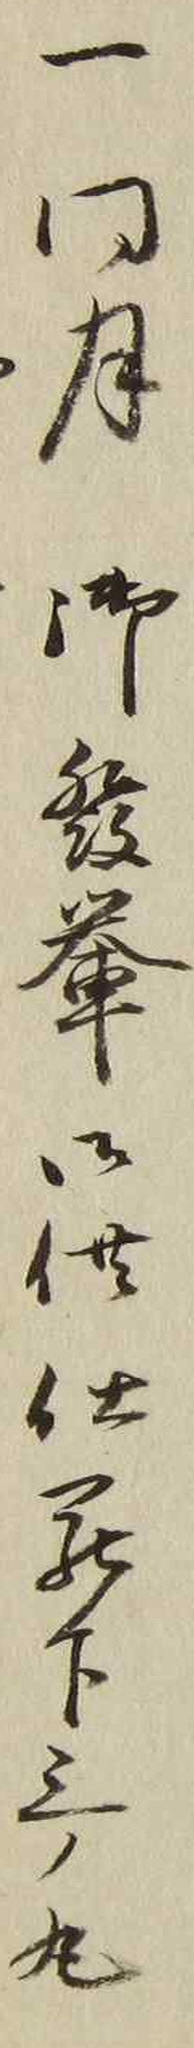一同月御発挙御供仕罷下三ノ丸
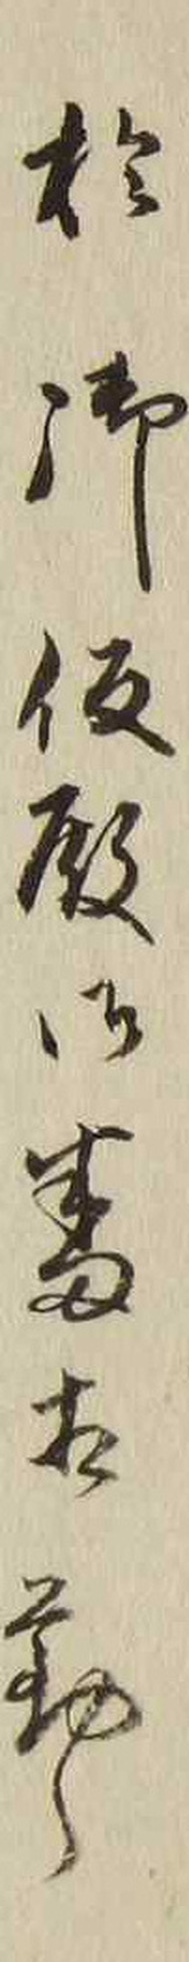於御仮殿御番相勤候
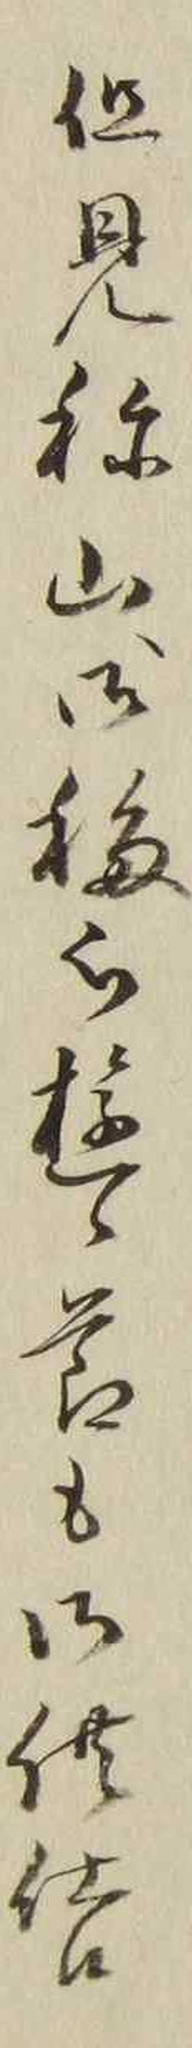但見称山へ御移被遊候節も御供仕候

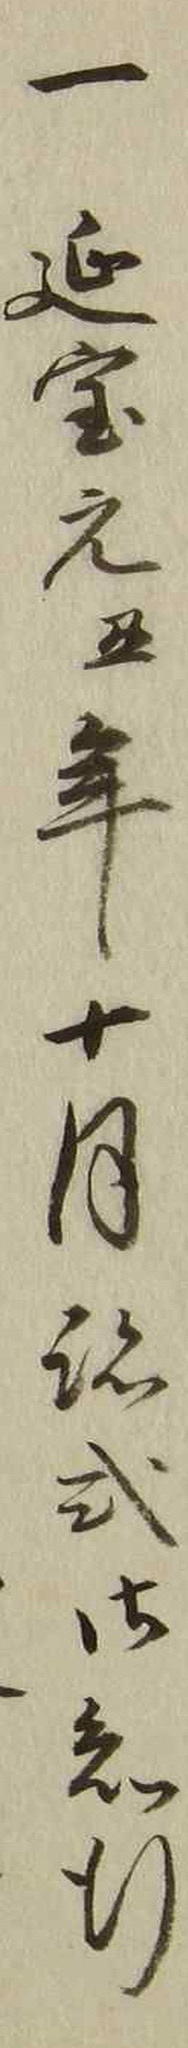一延宝元丑年十月跡式御知行
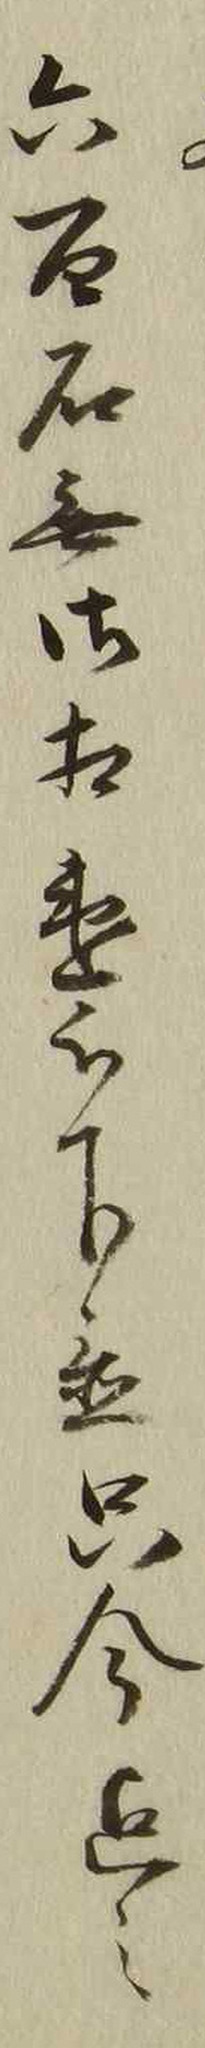六百石無御相違被下置只今迄之
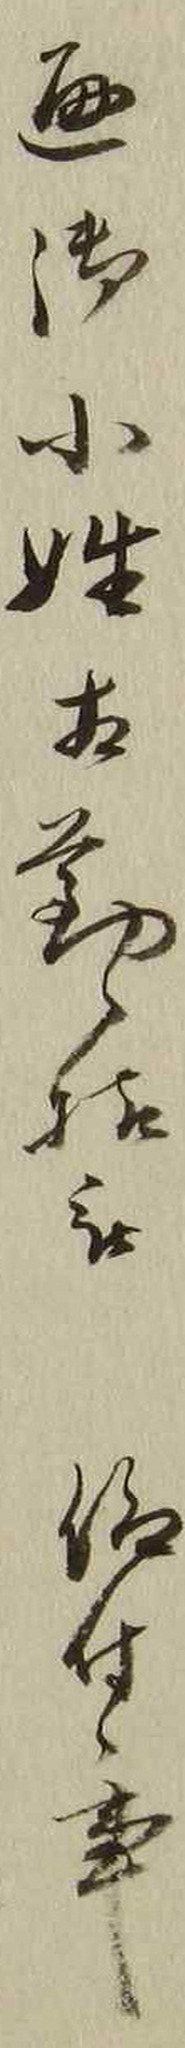通御小姓相勤候様被仰付候事
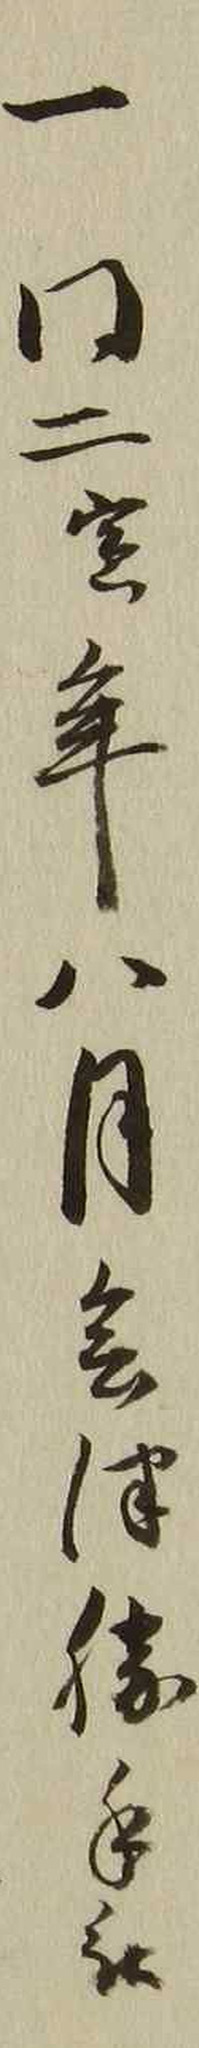一同二寅年八月会津勝手被
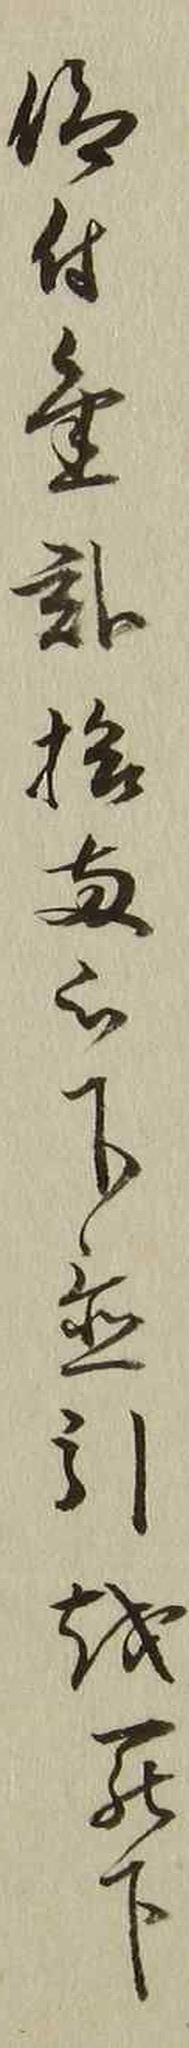仰付金弐拾両被下置引越罷下
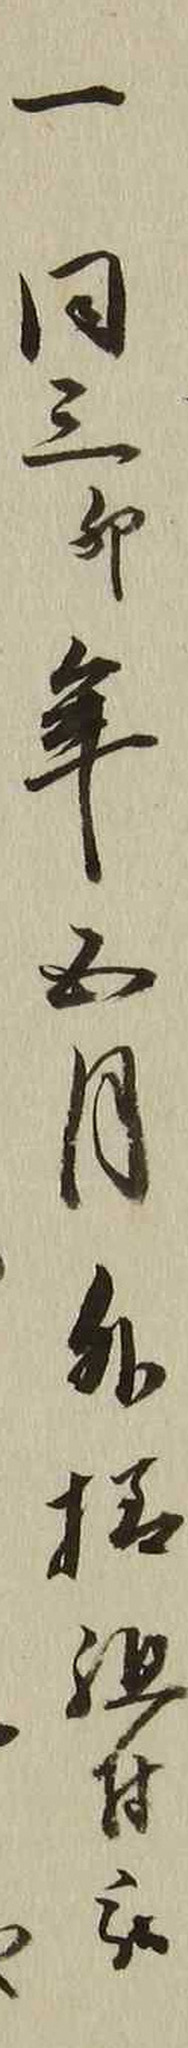一同三卯年五月外様組付被
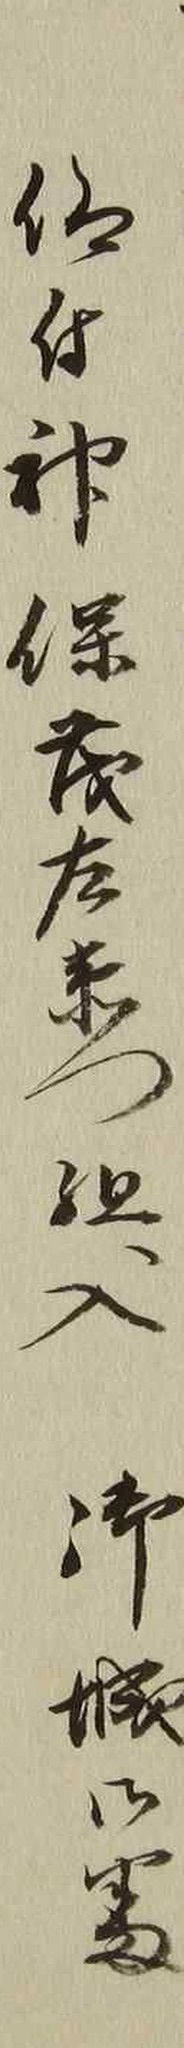仰付神保茂左衛門組へ入御城御番
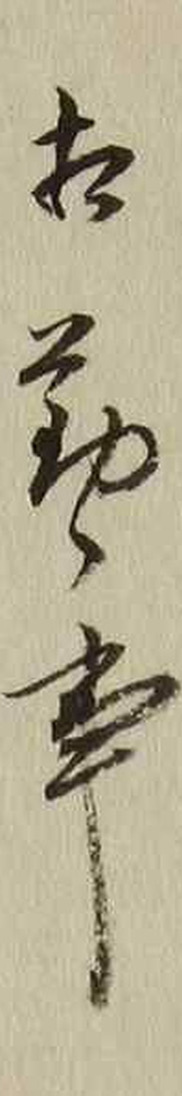相勤候事
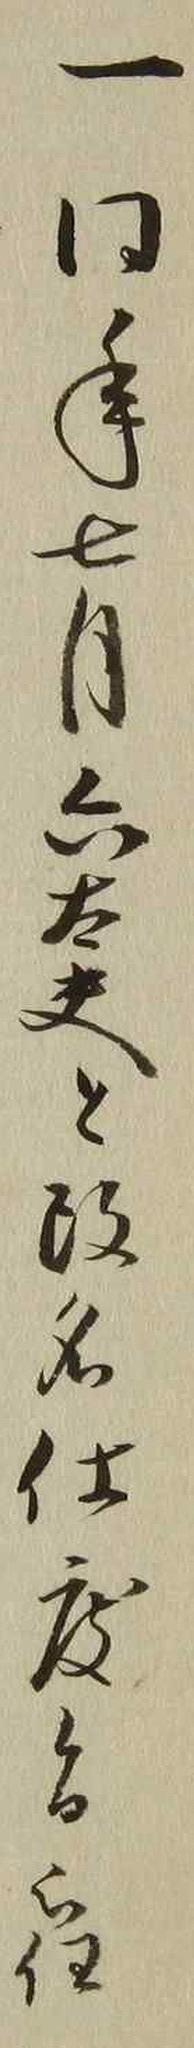一同年七月六太夫と改名仕度旨被任
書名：諸士系譜　巻之69　を之部3
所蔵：会津若松市立会津図書館
